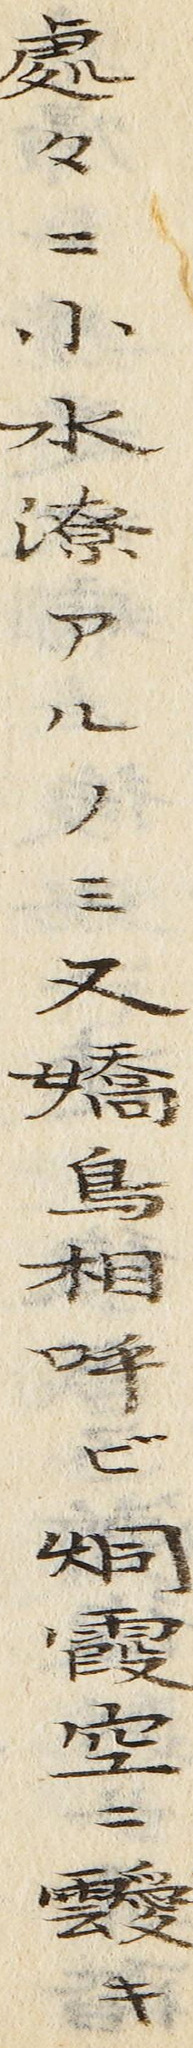処々ニ小水潦アルノミ又嬌鳥相呼ビ煙霞空ニ靉キ
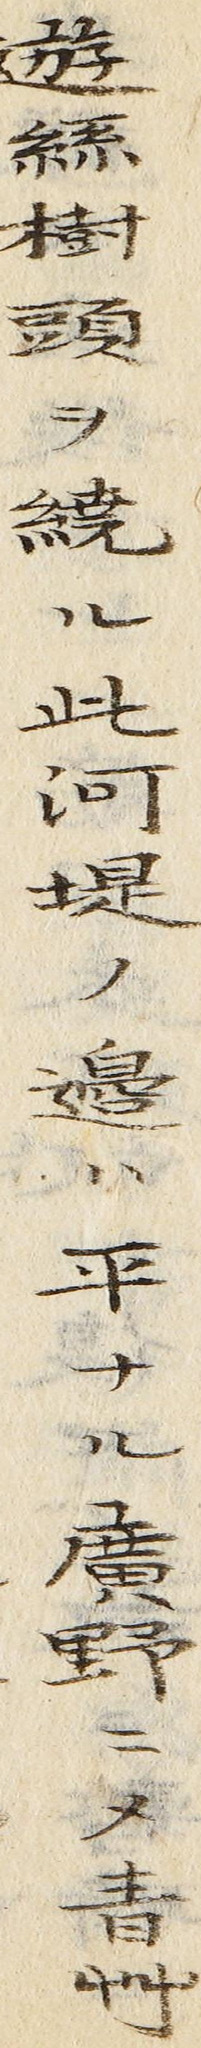遊絲樹頭ヲ繞ル此河堤ノ辺ハ平ナル広野ニシテ青艸
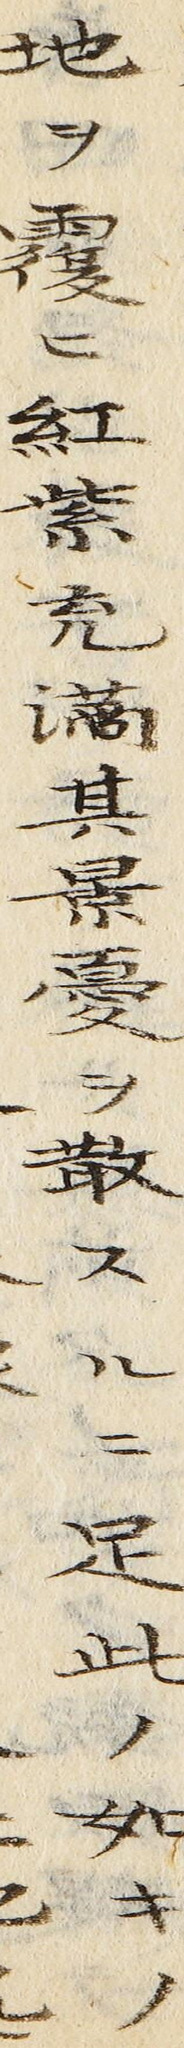地ヲ覆ヒ紅紫充満其景憂ヲ散スルニ足此ノ如キノ
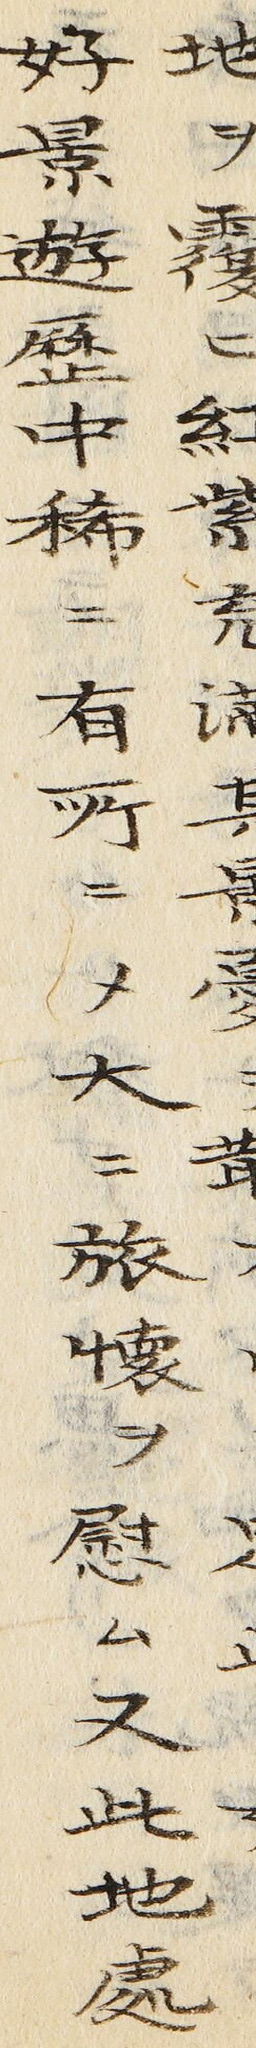好景遊歴中稀ニ有所ニシテ大ニ旅懐ヲ慰ム又此地処
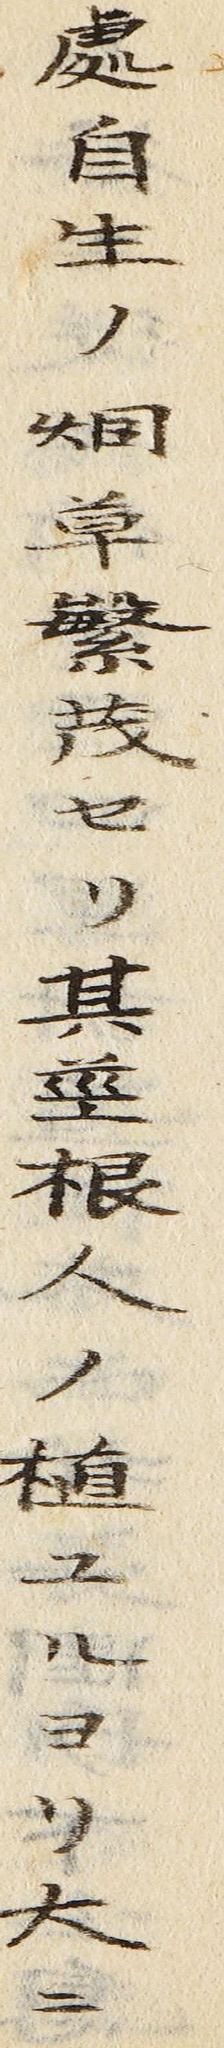処自生ノ煙草繁茂セリ其茎根人ノ植ユルヨリ大ニ
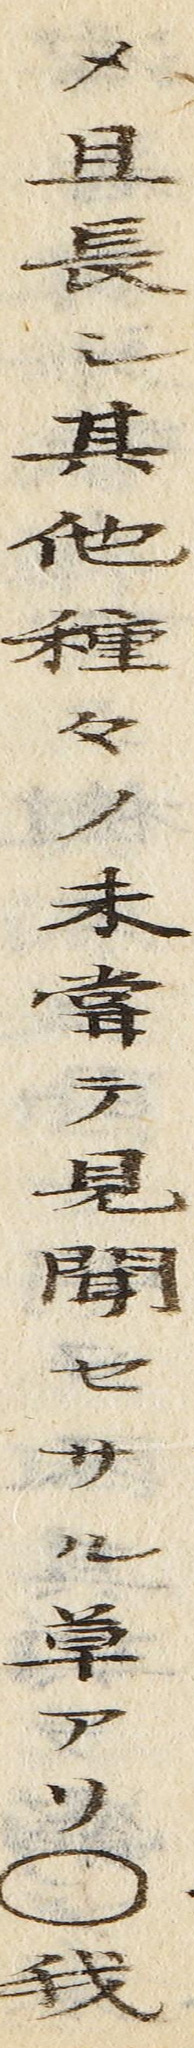シテ且長シ其他種々ノ未嘗テ見聞セサル草アリ◯我
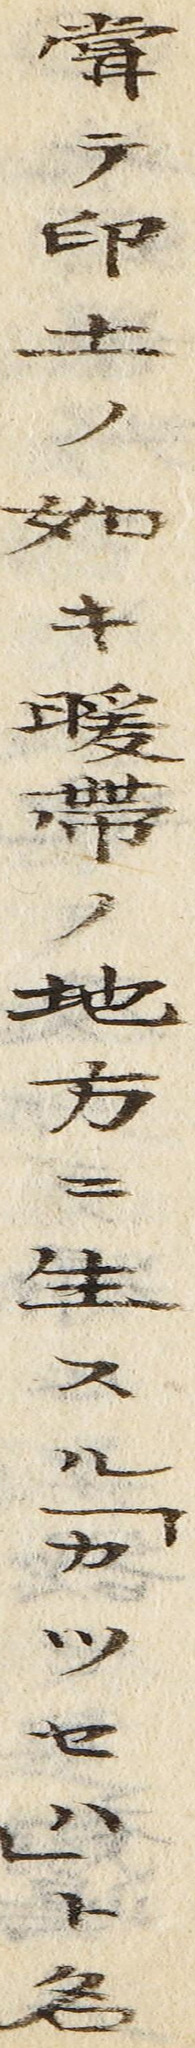嘗テ印土ノ如キ暖帯ノ地方ニ生スル「カツセハ」ト名
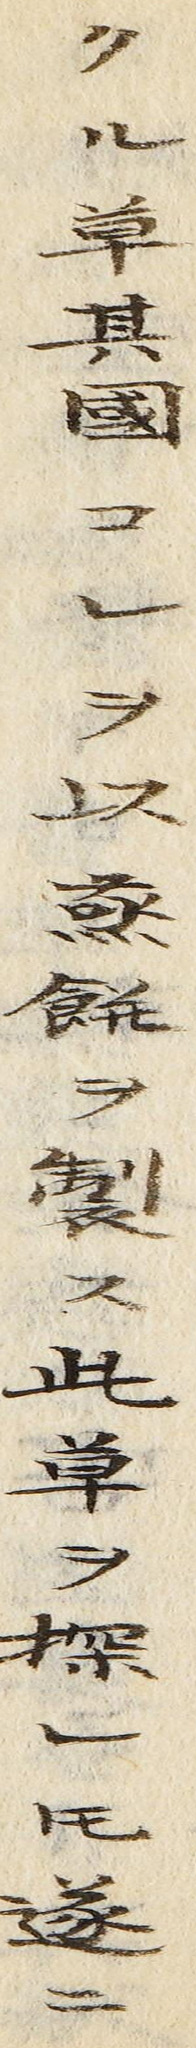クル草其国コレヲ以蒸餅ヲ製ス此草ヲ探レトモ遂ニ
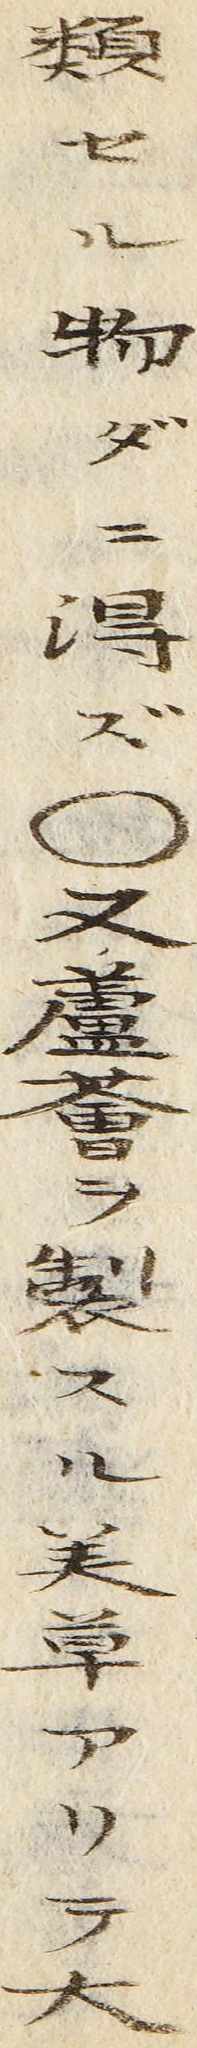類セル物ダニ得ズ◯又蘆薈ヲ製スル美草アリテ大
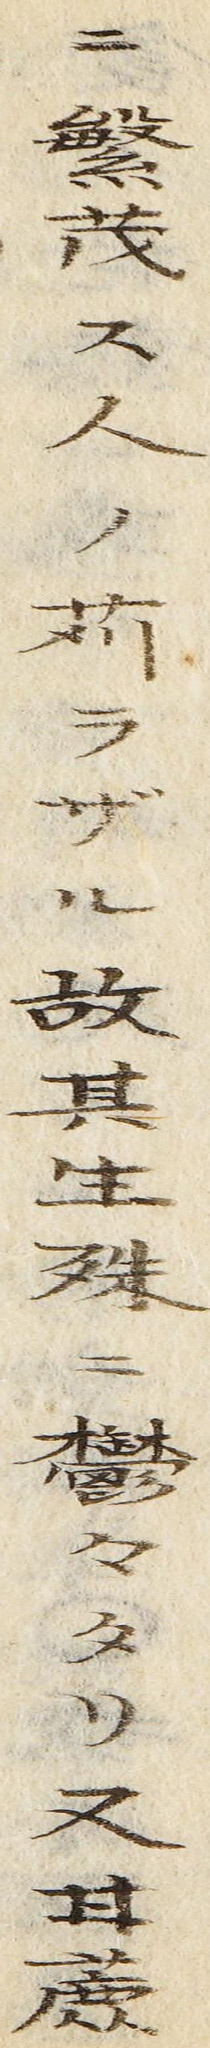ニ繁茂ス人ノ苅ラザル故其生殊ニ鬱々タリ又甘蔗
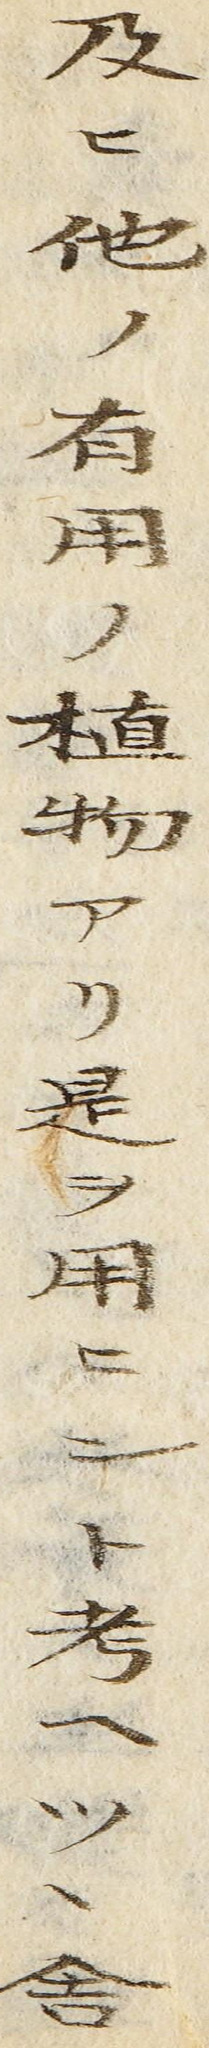及ヒ他ノ有用ノ植物アリ是ヲ用ヒント考ヘツヽ舎
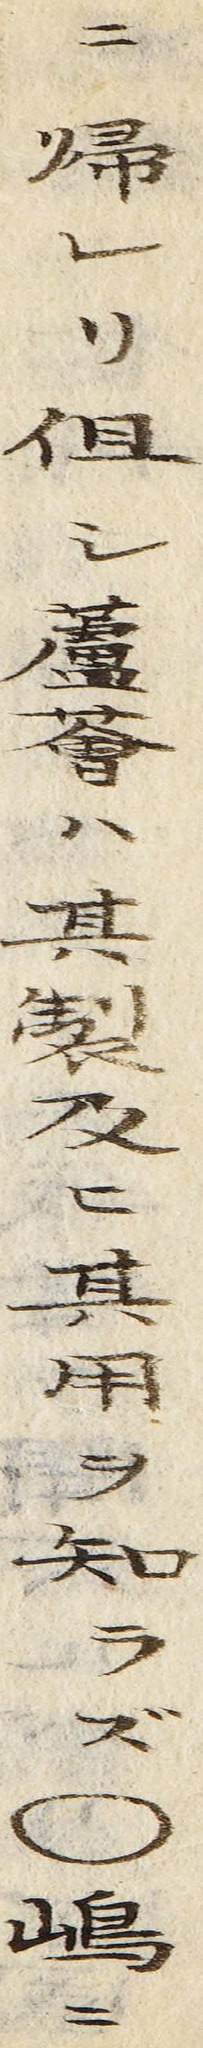ニ帰レリ但シ蘆薈ハ其製及ヒ其用ヲ知ラズ◯島ニ
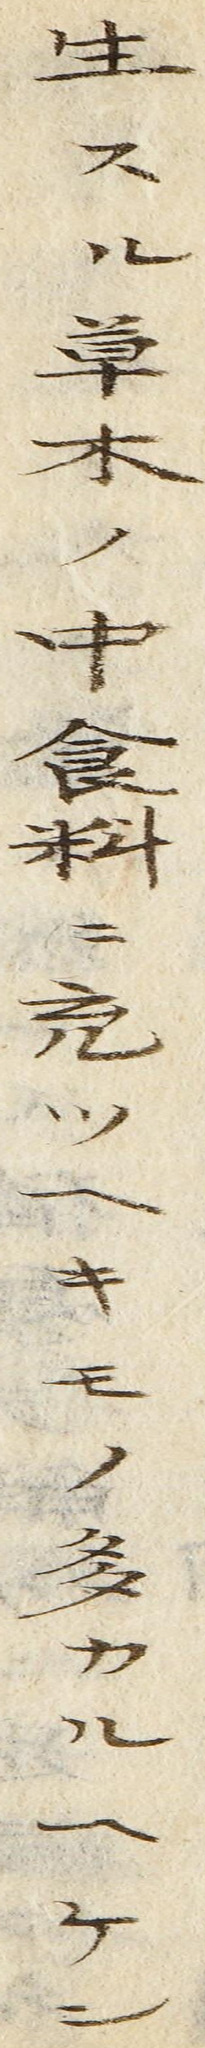生スル草木ノ中食料ニ充ツヘキモノ多カルヘケン
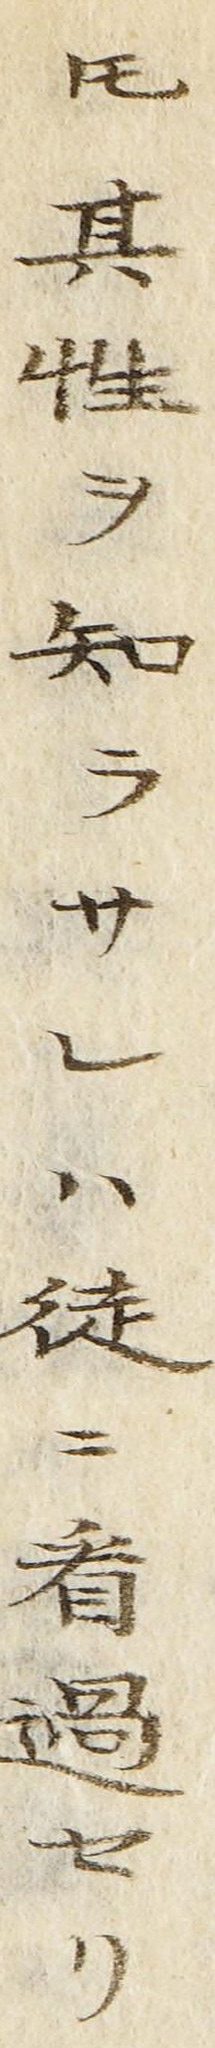トモ其性ヲ知ラサレハ徒ニ看過セリ
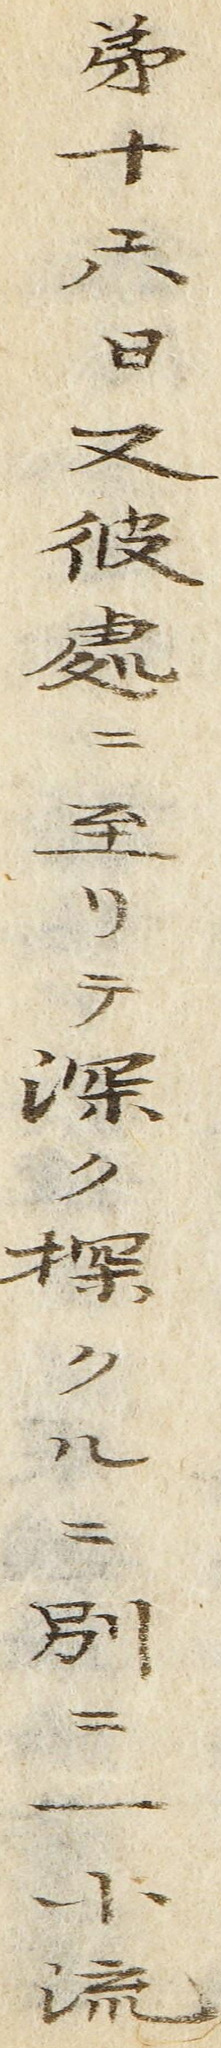第十六日又彼処ニ至リテ深ク探クルニ別ニ一小流

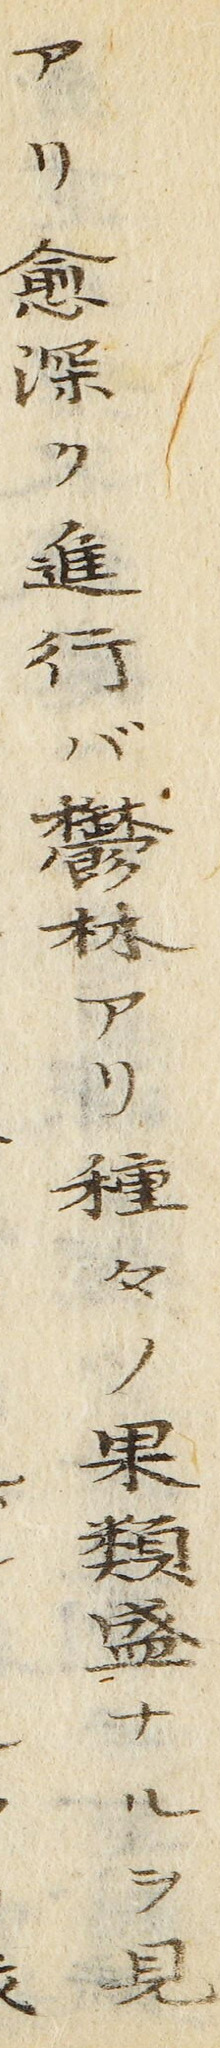アリ愈深ク進行バ鬱林アリ種々ノ果類盛ナルヲ見
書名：漂流紀事
